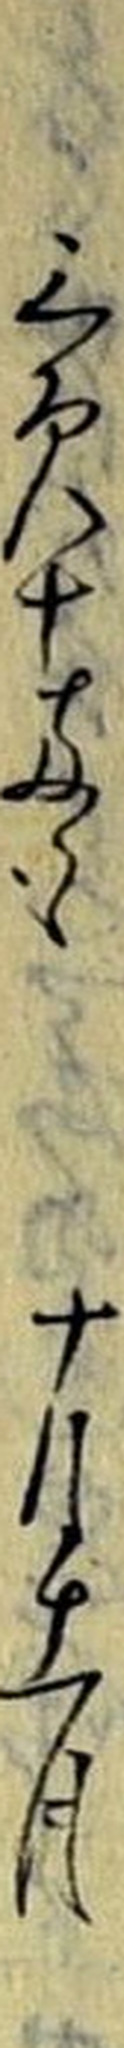三百八十両つヽ十月十一月
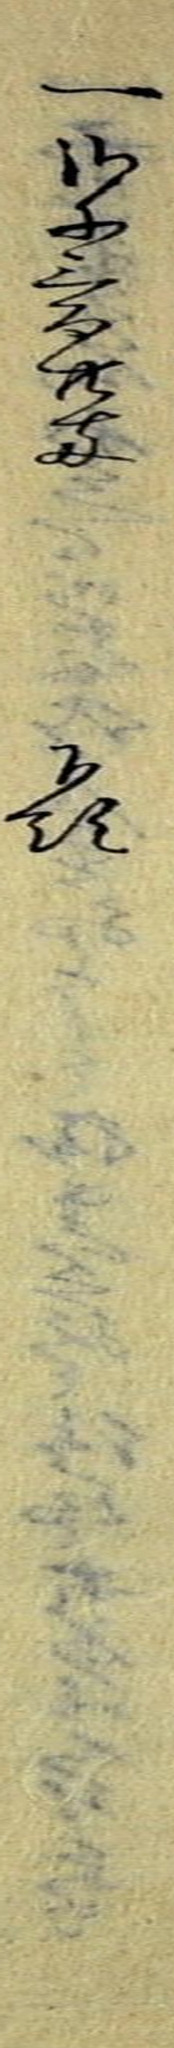一弐千三百廿両下領
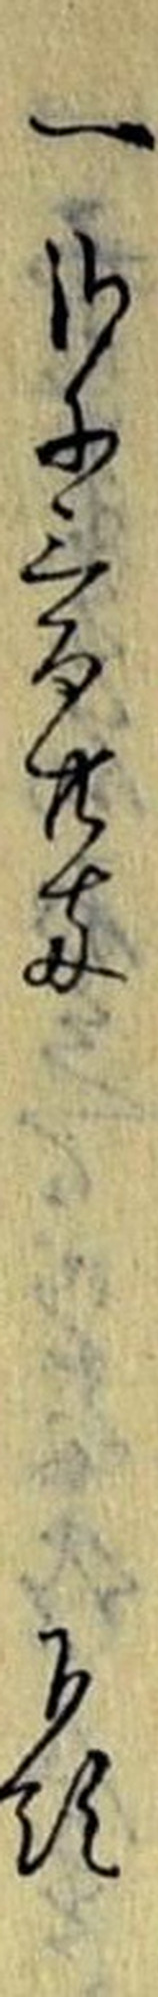一弐千三百廿両下領
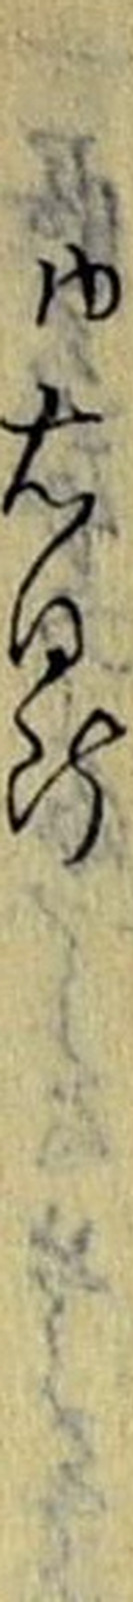内右同断
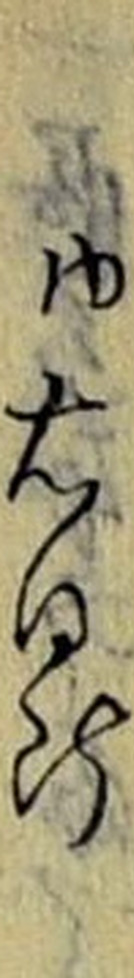内右同断
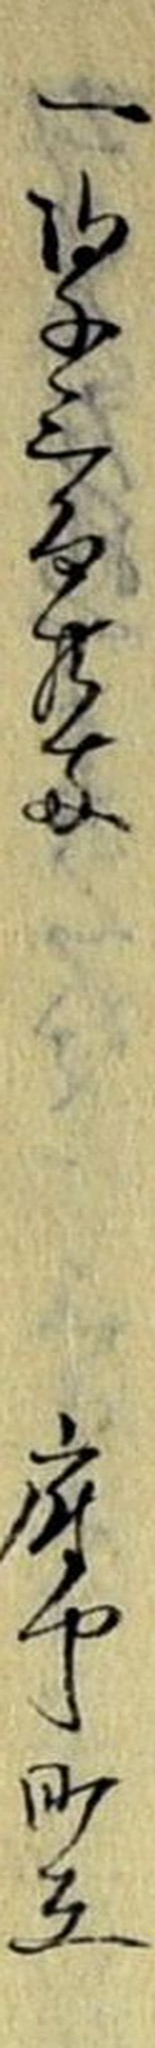一弐千三百廿両府中町在
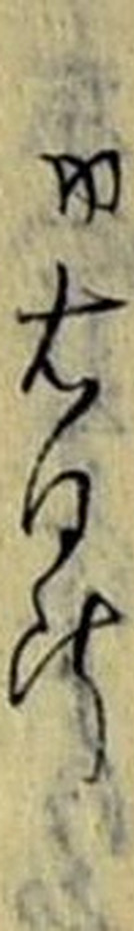内右同断
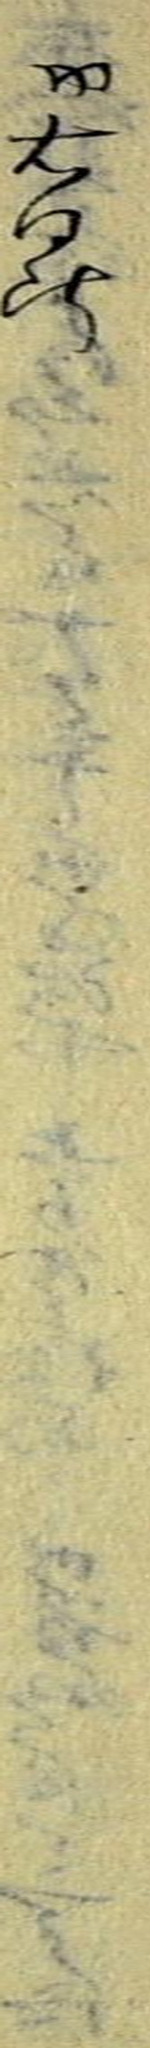内右同断
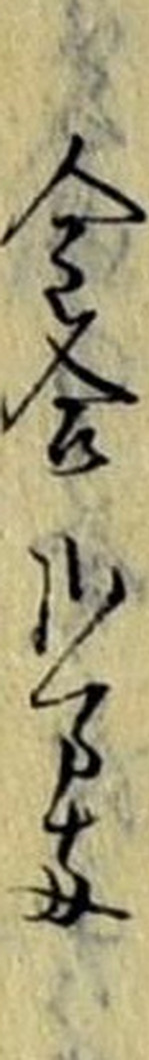金合弐万両
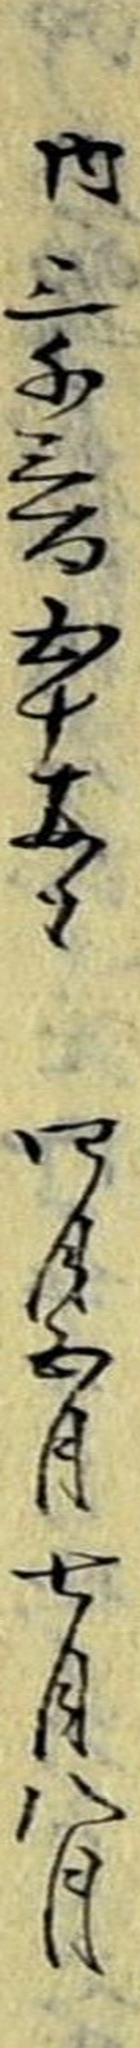内三千三百五十両つヽ四月五月七月八月
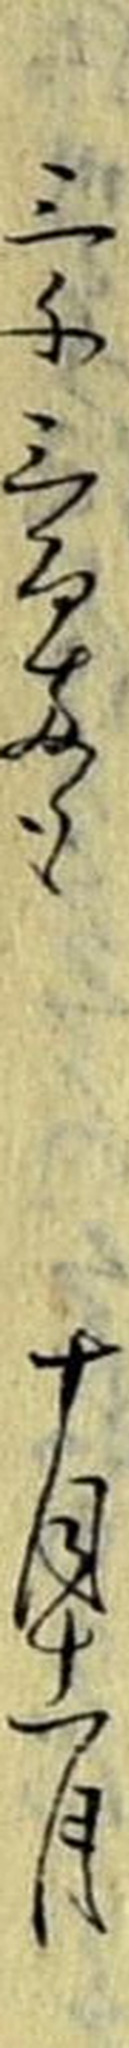三千三百両つヽ十月十一月

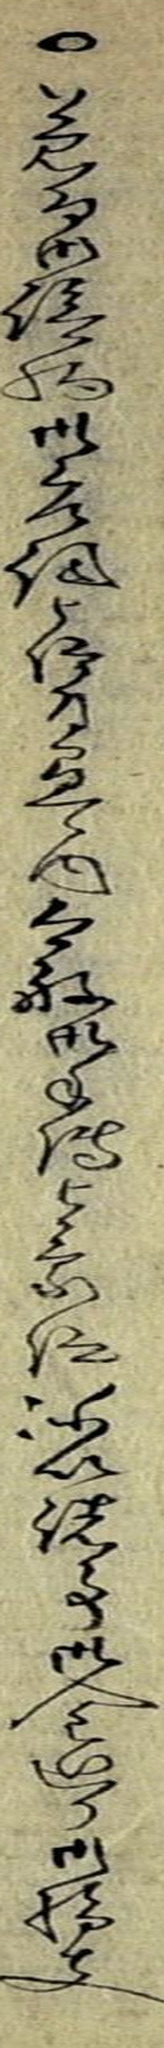○兼而御倹約御取調被仰付置候内今般御手伝被蒙仰弥以諸事御金廻り御指支
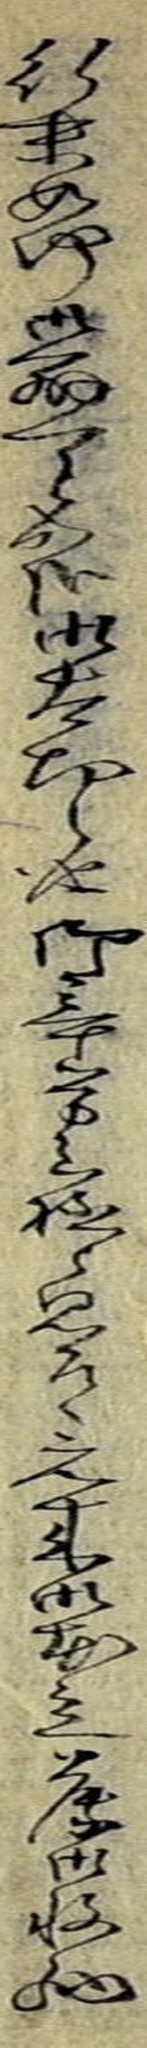行末如何御弁可被成哉御太切之儀御辛労至極被思召候元来御本立薄御収納
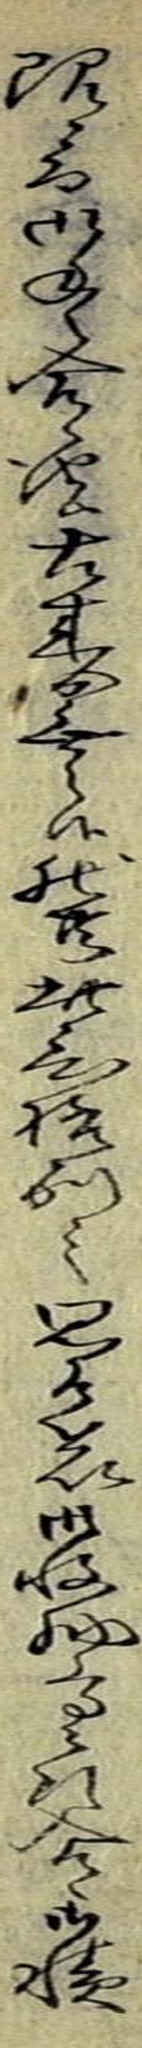限に而御手之合候儀は古来ゟ無之候然共此度格別之思召を以御収納高に引合候御積
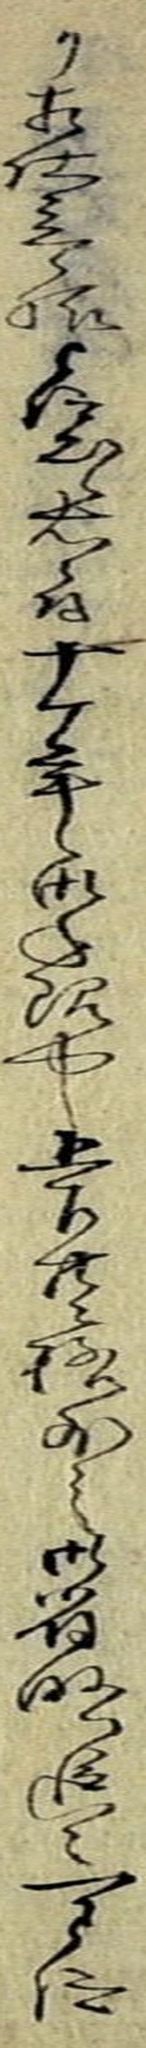り相仕立候様被仰出候右に付十ヶ年御年限中上下共に格外之御省略追々可被仰
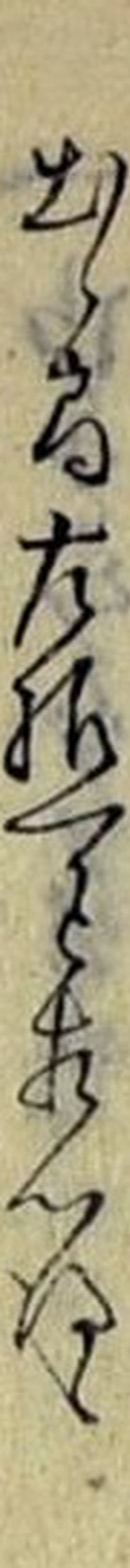出候間左様可被相心得候
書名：命令之部 四
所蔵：福井県文書館 Fukui Prefectural Archives
